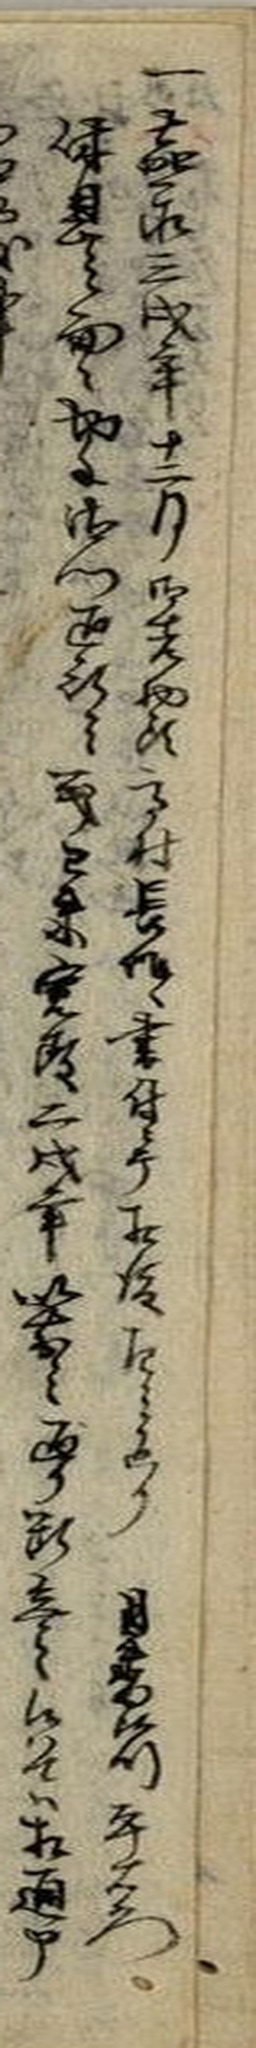休息之面々切手御門通行之義已来寛政二戌年以前之通断無之候ハてハ相通申

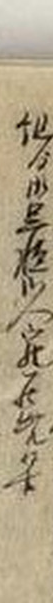組ゟ御足軽弐人宛罷出ル筈
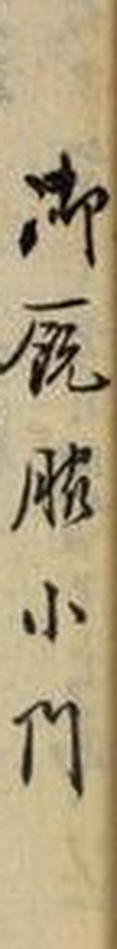御厩脇小門
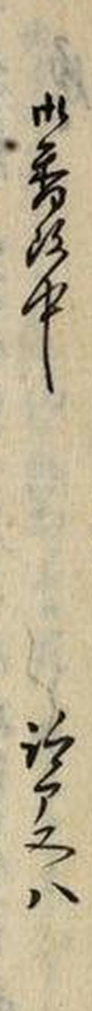御番改中跡部又八
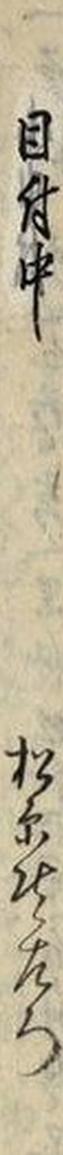目付中松原次郎左衛門
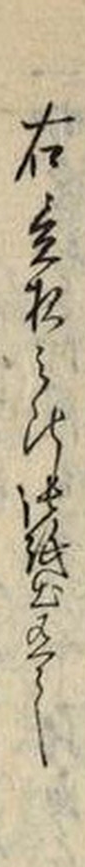右昼夜之断張紙出有之
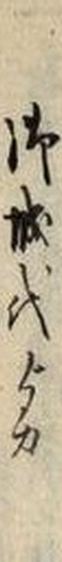御城代与力
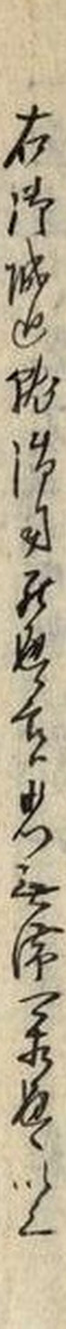右御城廻就御用罷通候節御門無滞可相通候以上
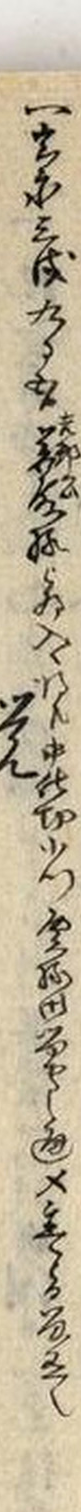一宝永三戌九月五日若殿様被為入候得共中仕切小門殿様御留守之通〆置候旨留有之
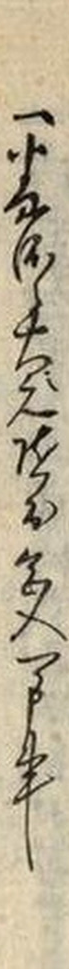一番所之火之元随分念入可申候事
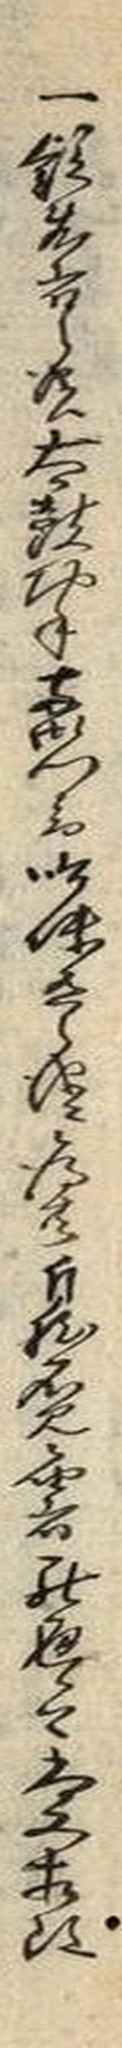一疑敷者之儀は太鼓切手両御門に而吟味有之儀に候得共自然不見届候者罷通候はゝ尚又相改
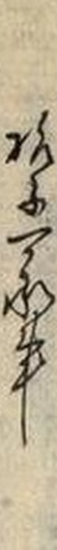様子可承事
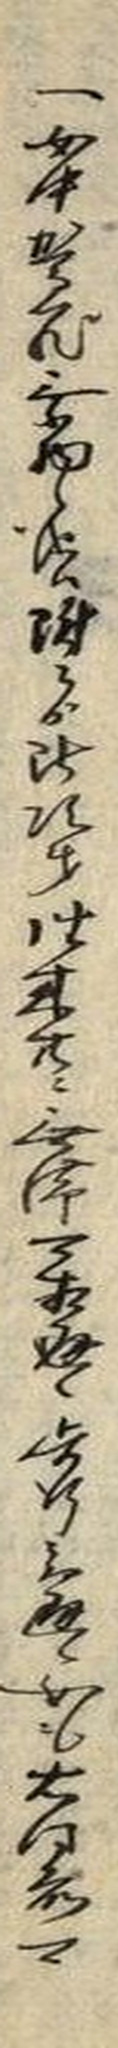一女中駕籠乗物之儀は附々ゟ断次第往来共に無滞可相通候歩行に而通候女も右同前可
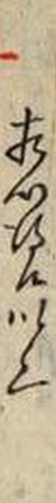相心得候以上

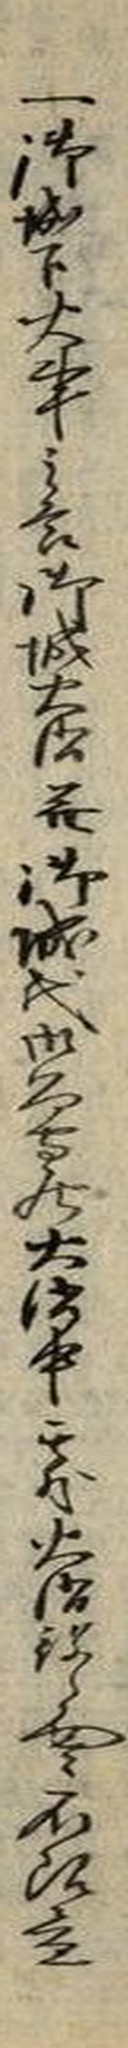一御城下火事之節御城火消并御城代御留守居火消中其外火消役之面々不限昼
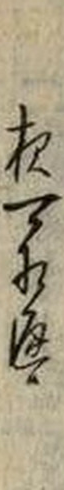夜可相通候
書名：御門御櫓之部
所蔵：福井県文書館 Fukui Prefectural Archives
